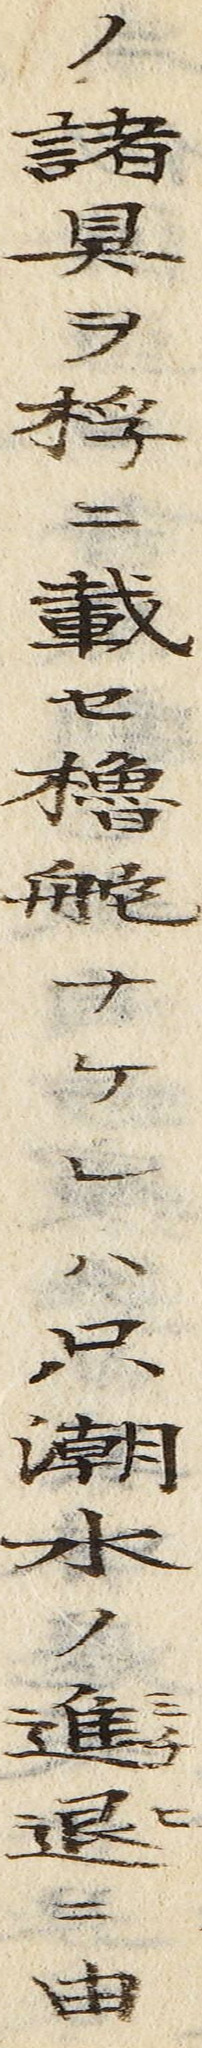ノ諸具ヲ桴ニ載セ櫓舵ナケレハ只潮水ノ進退ニ由
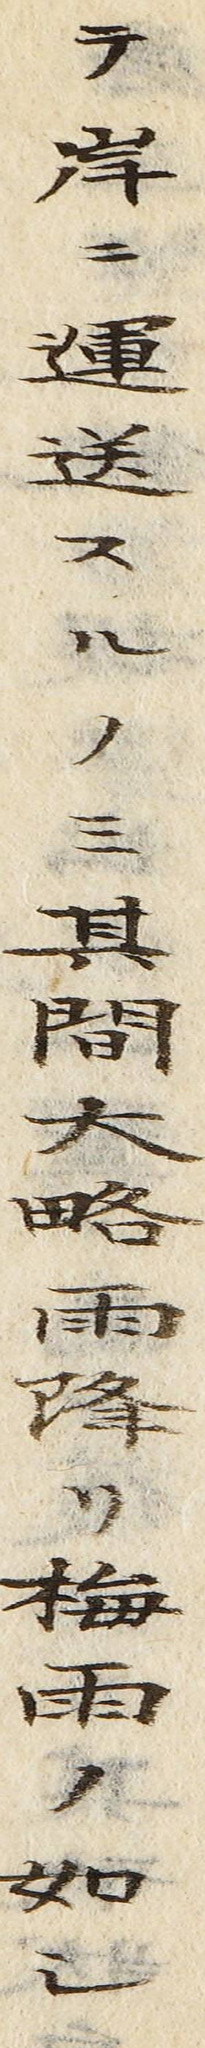テ岸ニ運送スルノミ其間大略雨降リ梅雨ノ如シ
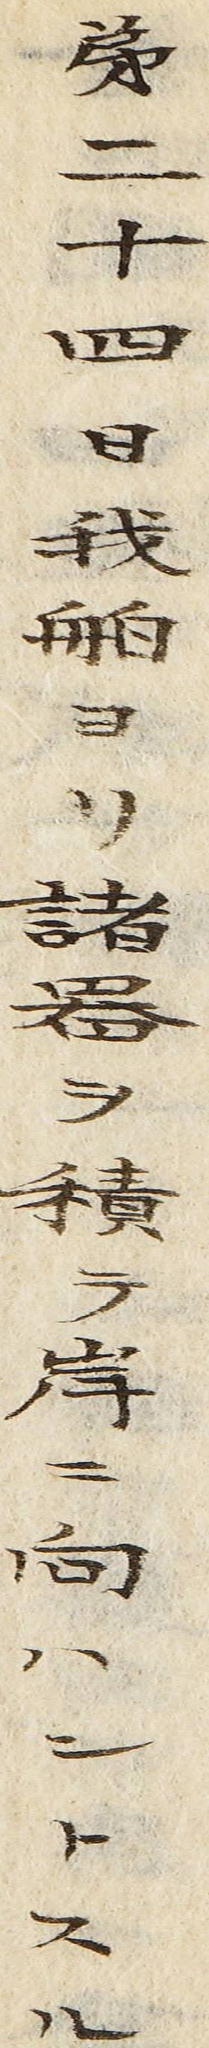第二十四日我舶ヨリ諸器ヲ積テ岸ニ向ハントスル
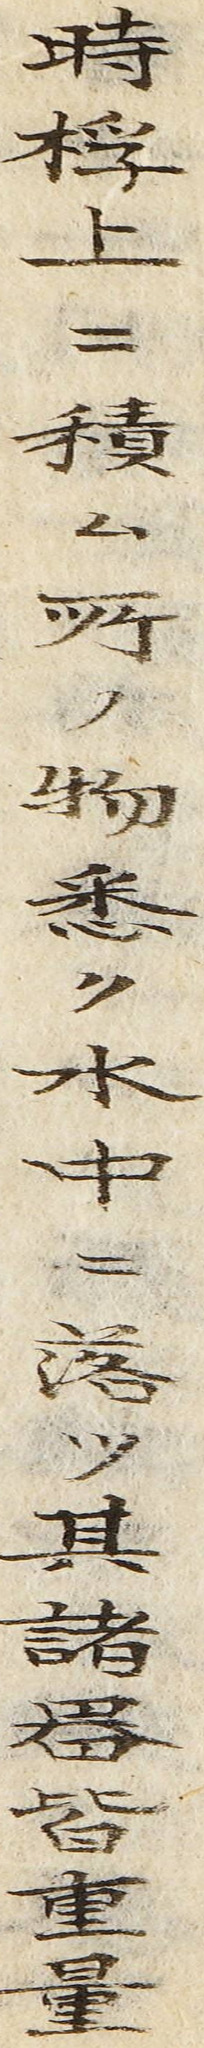時桴上ニ積ム所ノ物悉ク水中ニ落ツ其諸器皆重量
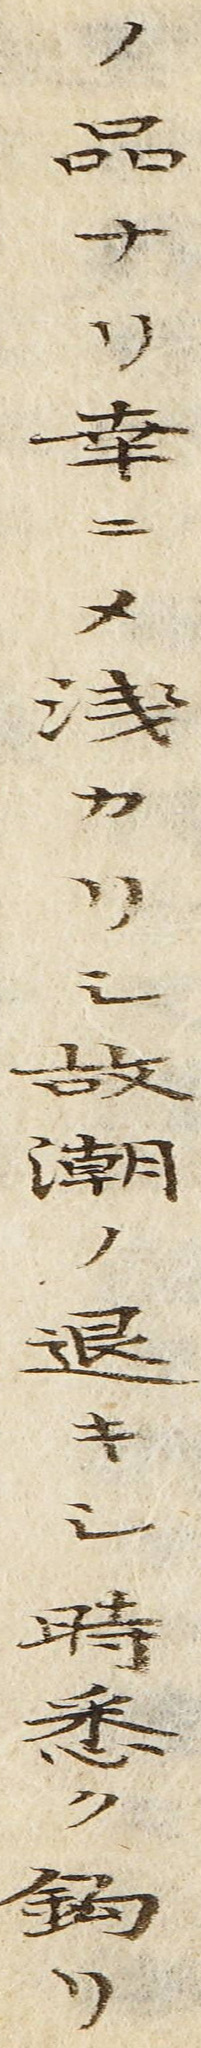ノ品ナリ幸ニシテ浅カリシ故潮ノ退キシ時悉ク鈎リ
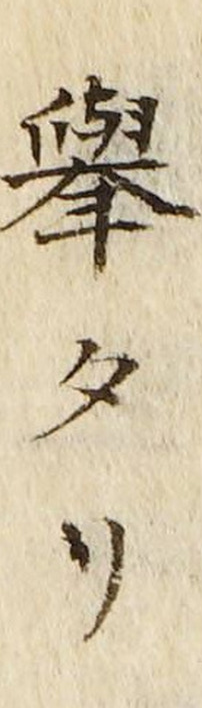挙タリ
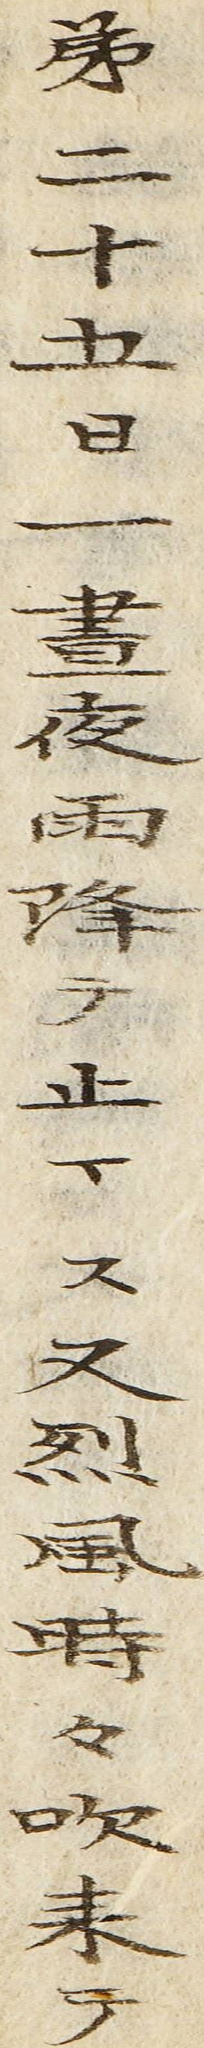第二十五日一昼夜雨降テ止マス又烈風時々吹来テ
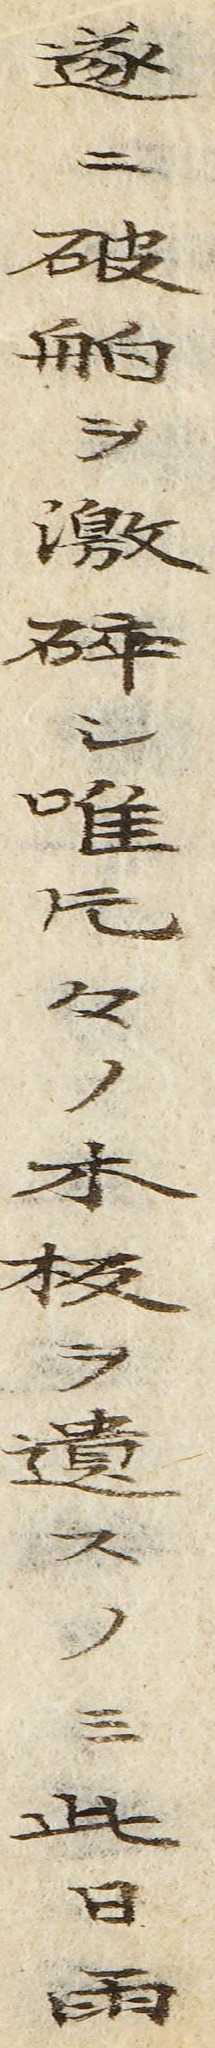遂ニ破舶ヲ激砕シ唯片々ノ木板ヲ遺スノミ此日雨
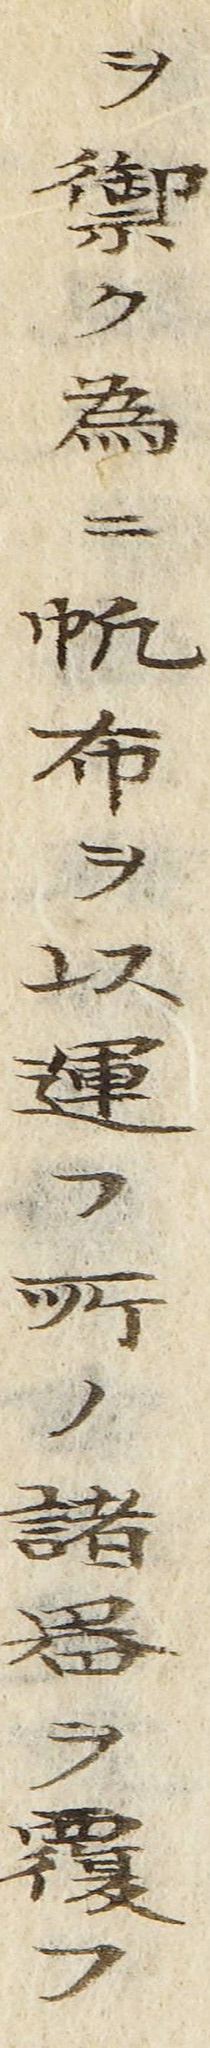ヲ禦ク為ニ帆布ヲ以運フ所ノ諸器ヲ覆フ
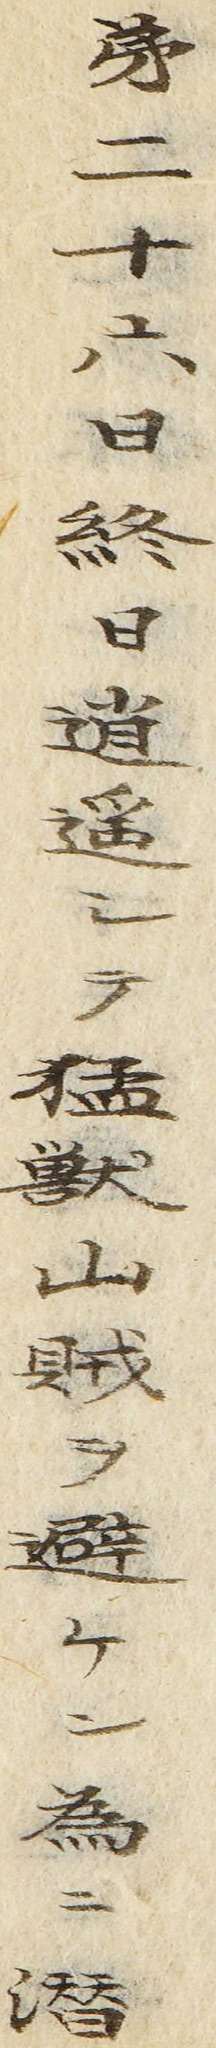第二十六日終日逍遥シテ猛獣山賊ヲ避ケン為ニ潜

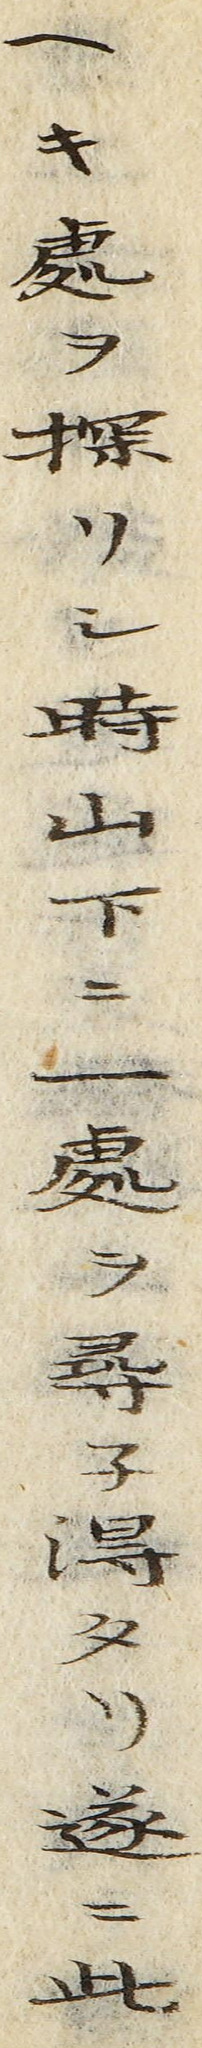ヘキ処ヲ探リシ時山下ニ一処ヲ尋ネ得タリ遂ニ此
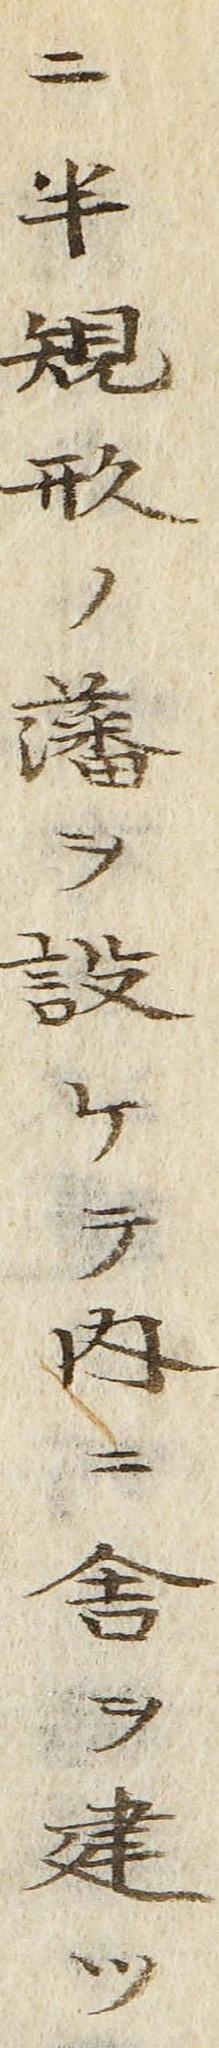ニ半規形ノ藩ヲ設ケテ内ニ舎ヲ建ツ
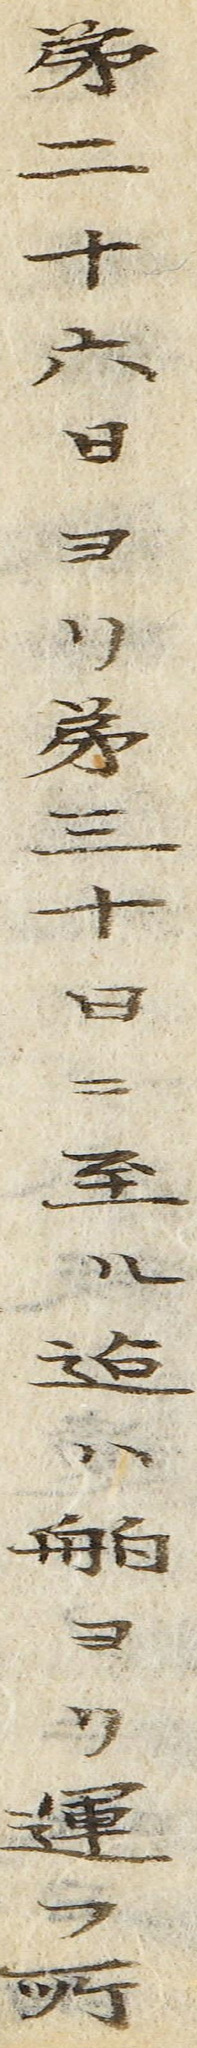第二十六日ヨリ第三十日ニ至ル迄ハ舶ヨリ運フ所
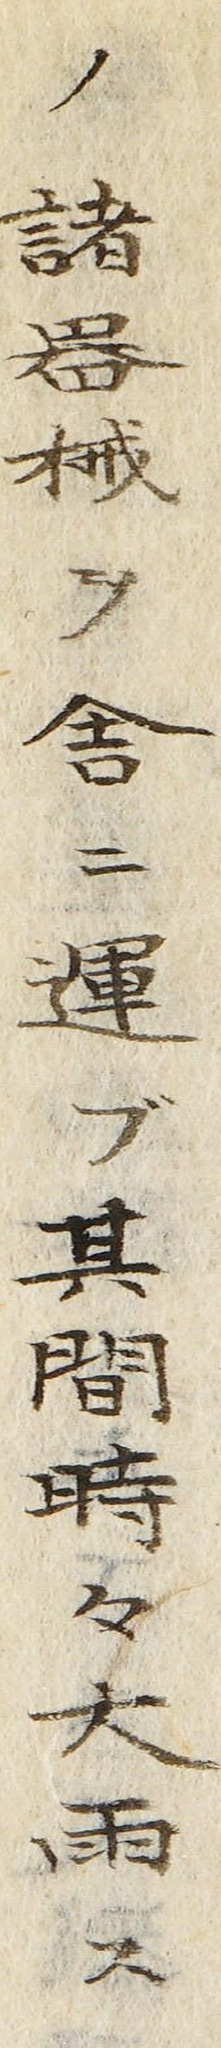ノ諸器械ヲ舎ニ運ブ其間時々大雨ス
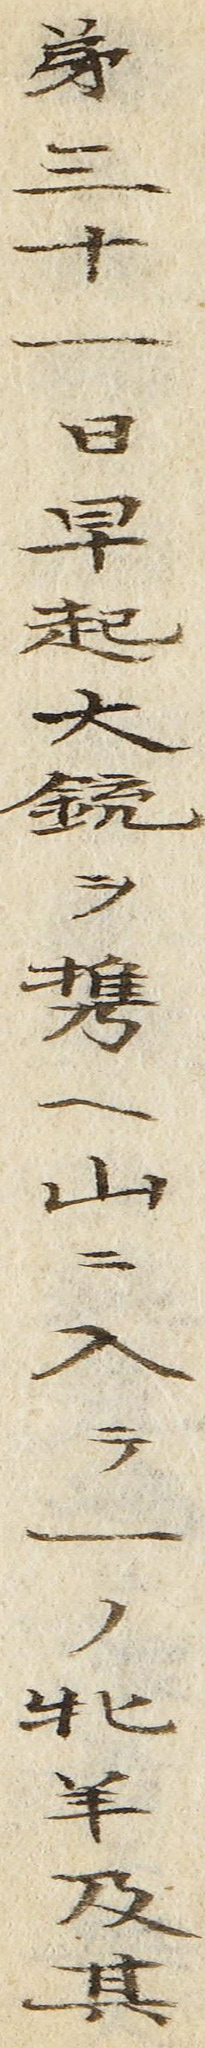第三十一日早起大銃ヲ携ヘ山ニ入テ一ノ牡羊及其
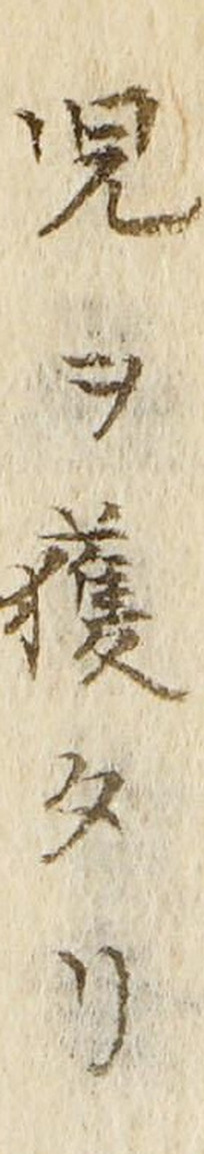児ヲ獲タリ
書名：漂流紀事
